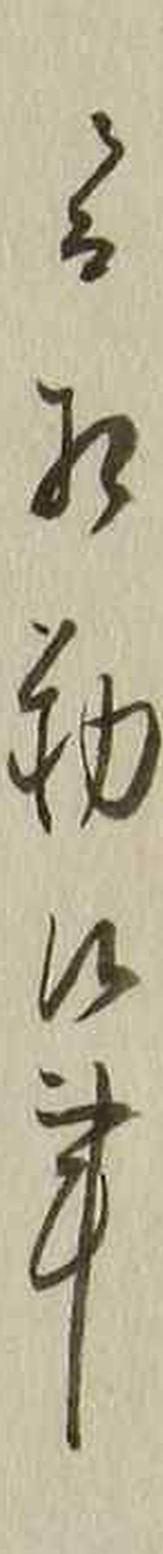ニ而相勤候事
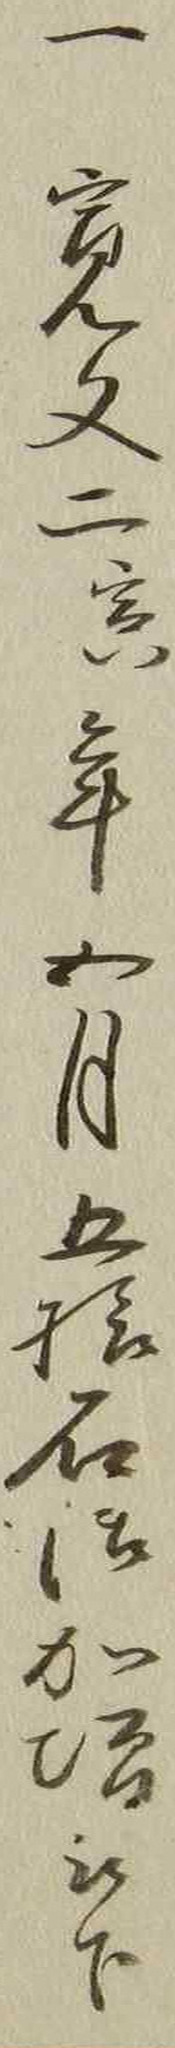一寛文二寅年五月五拾石御加増被下
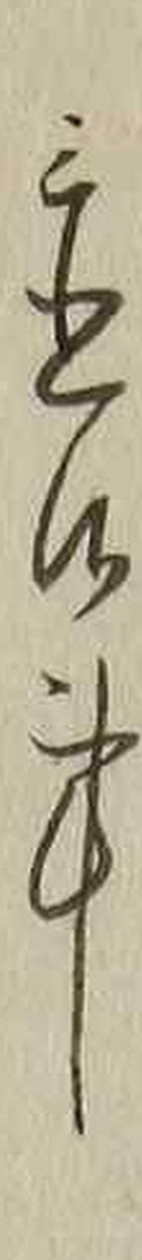置候事
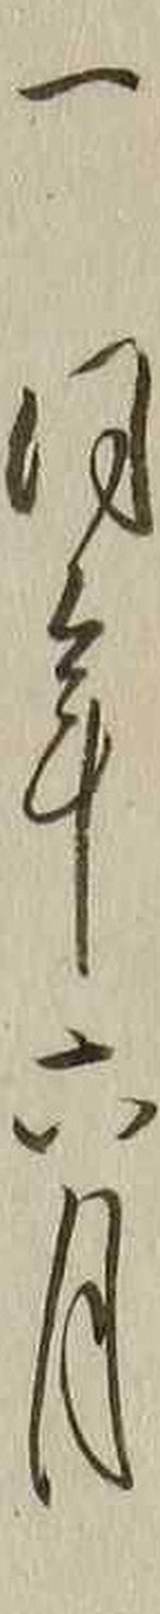一同年六月
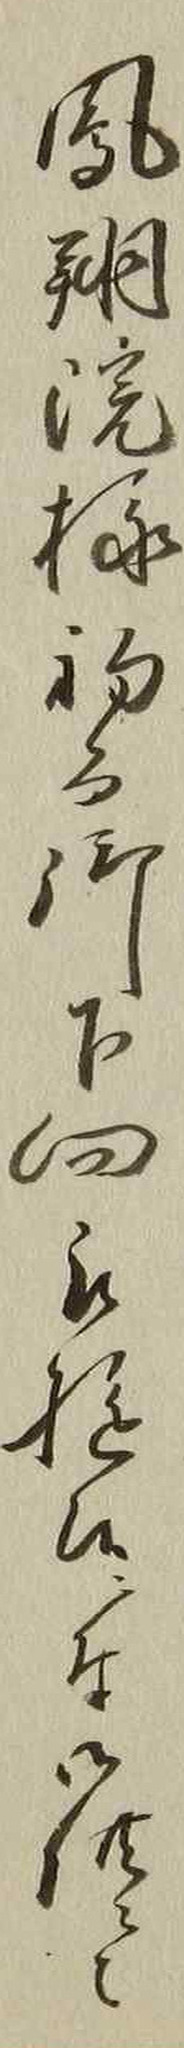鳳翔院様初而御下向被遊候ニ付御供ニ而
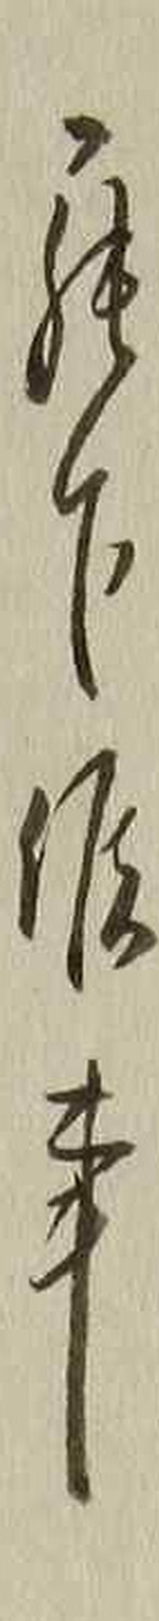罷下候事
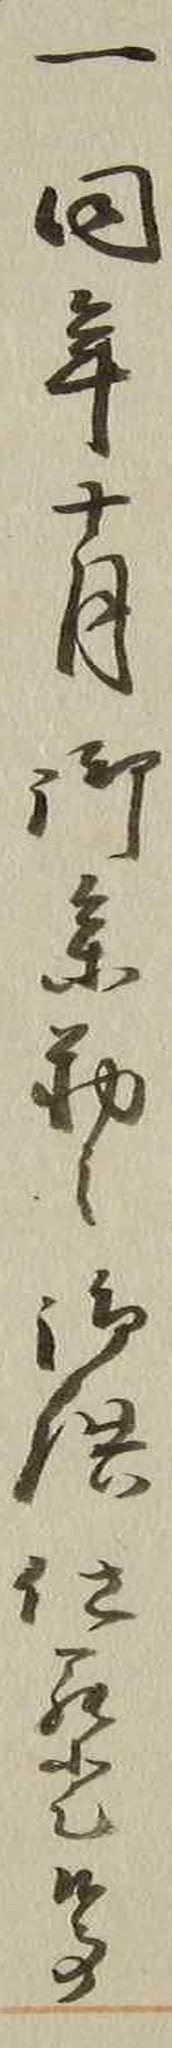一同年十月御参勤之御供仕罷登候事
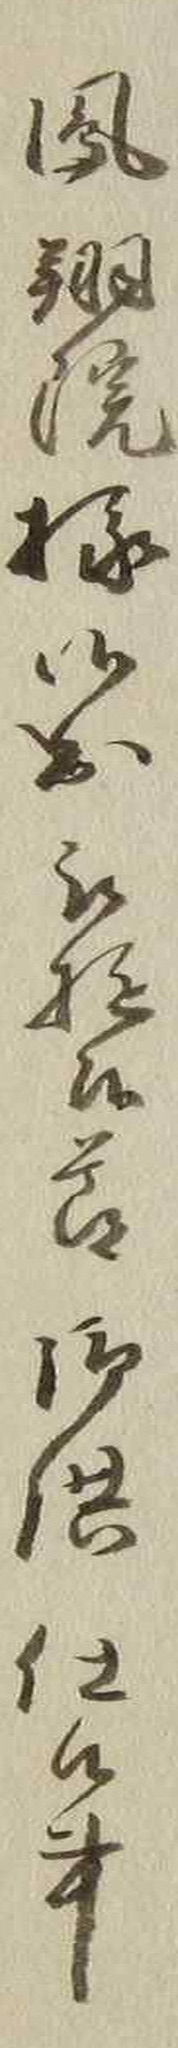鳳翔院様御出被遊候節御供仕候事
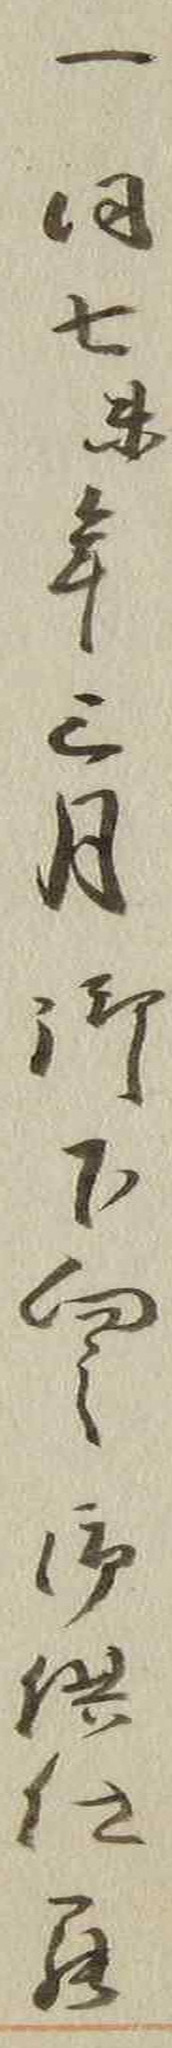一同七未年三月御下向之御供仕罷
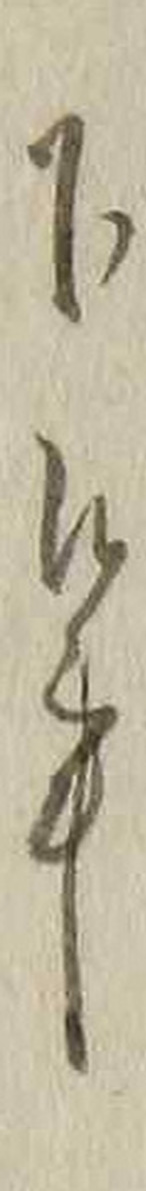下候事
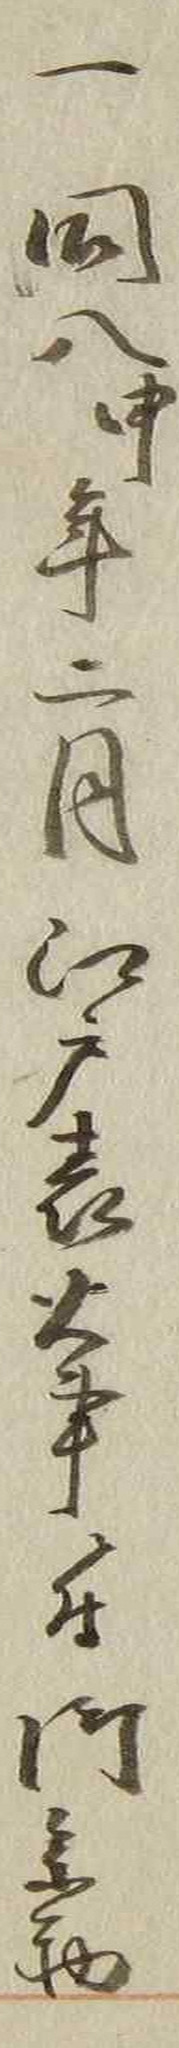一同八申年二月江戸表火事ニ付御参勤
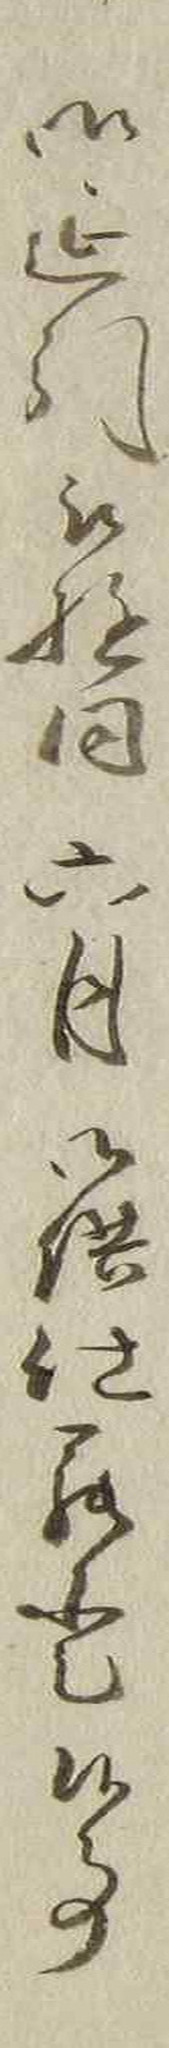御延引被遊同六月御供仕罷登候事
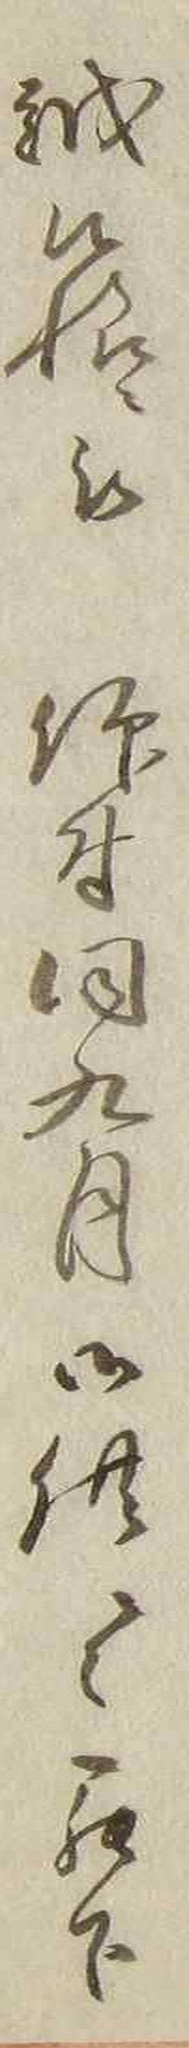越候様ニ被仰付同九月御供ニて罷下

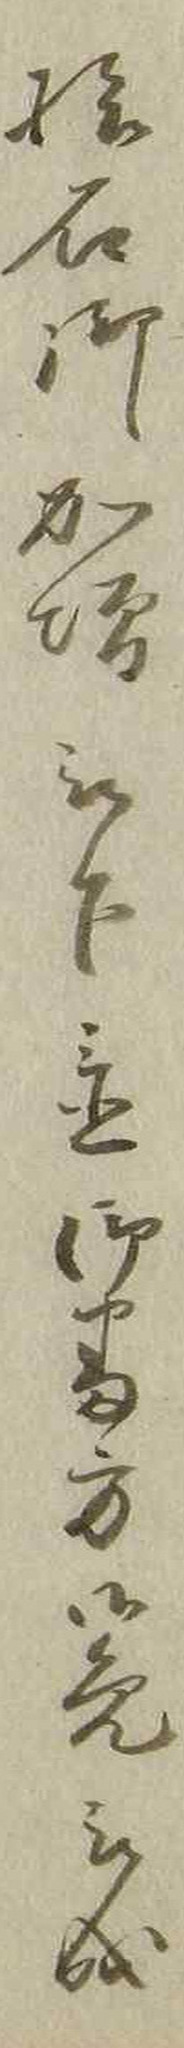拾石御加増被下置御番方御免被成
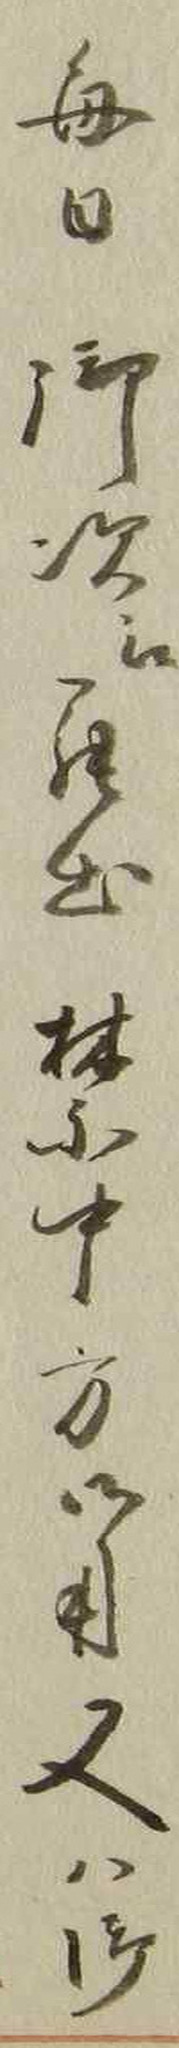毎日御次江罷出禁中方御用又ハ御
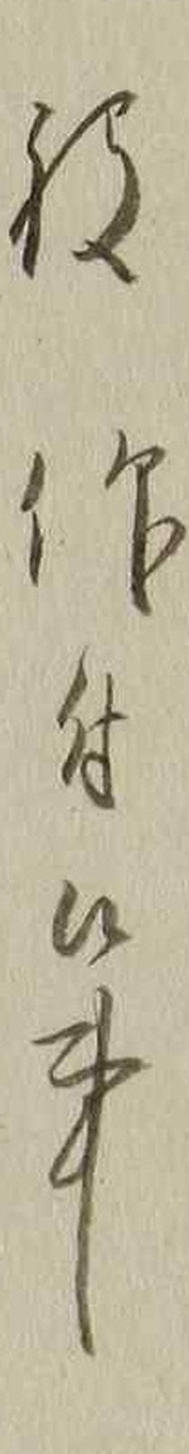被仰付候事
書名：諸士系譜　巻之122　よ之部5
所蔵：会津若松市立会津図書館
